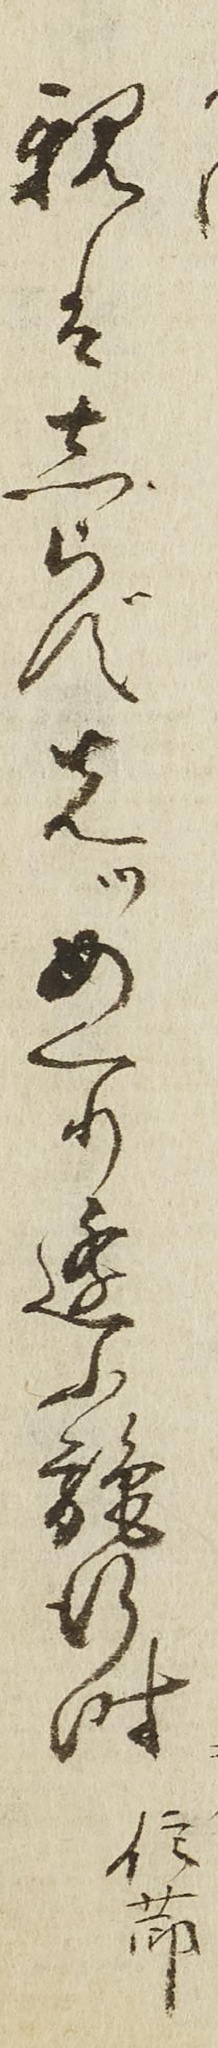親はしらず先ツめくり逢ふ施行時キタ信郎
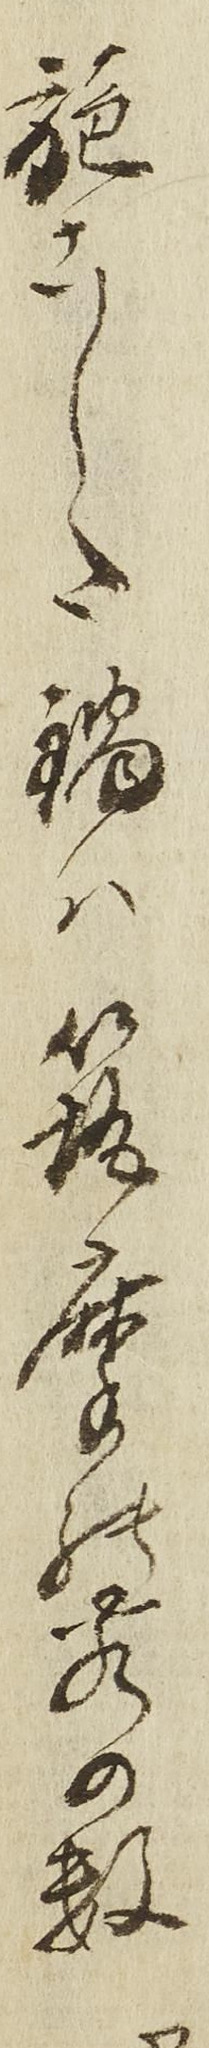施こした鍋は筑摩の客の数愚

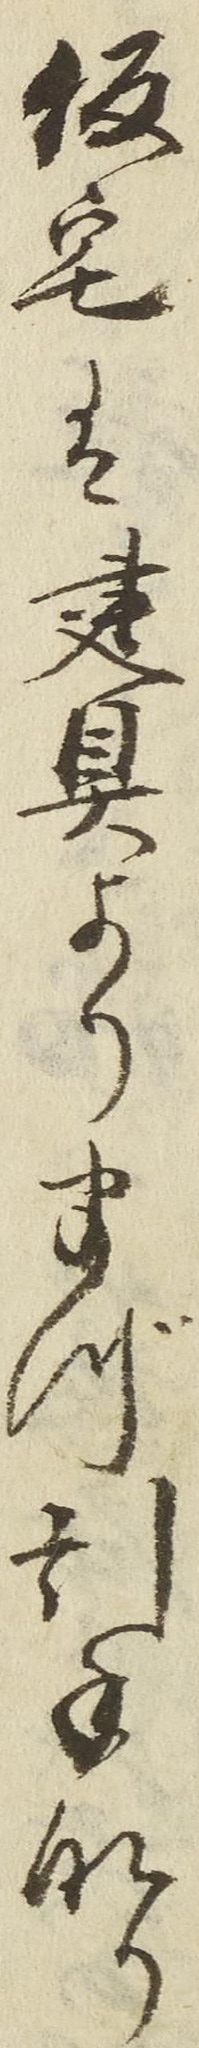仮宅は建具よりまづ引手なり喜多
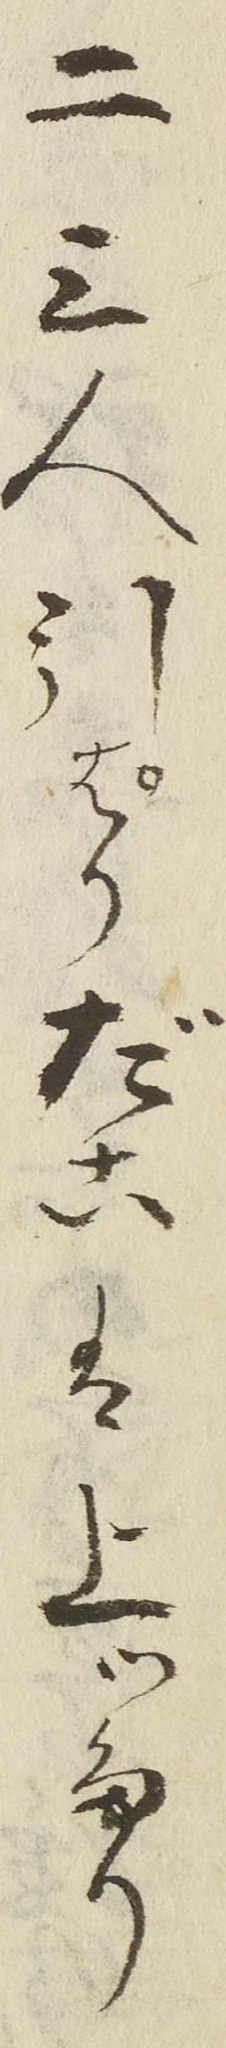二三人引ぱりだこは上ッたり〃
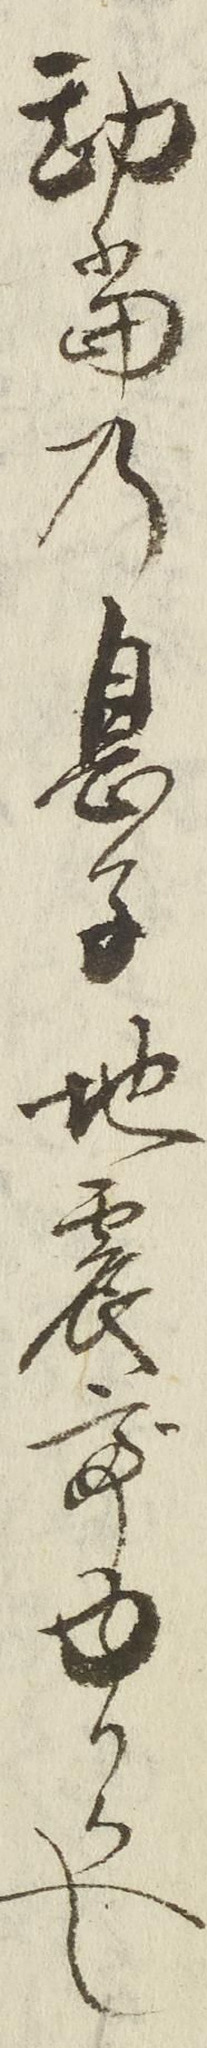勘当の息子地震でゆりかへし愚
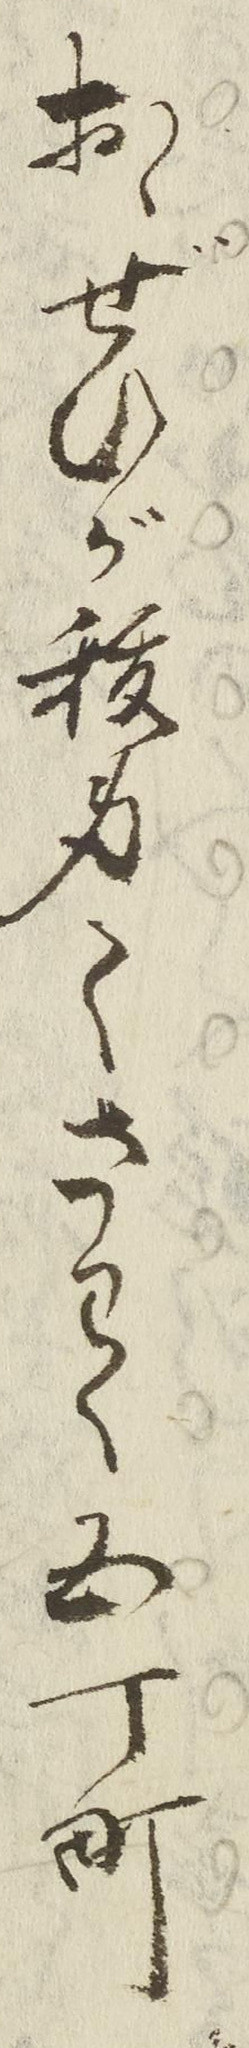おゝぜひが抜身てさわく五丁町〃
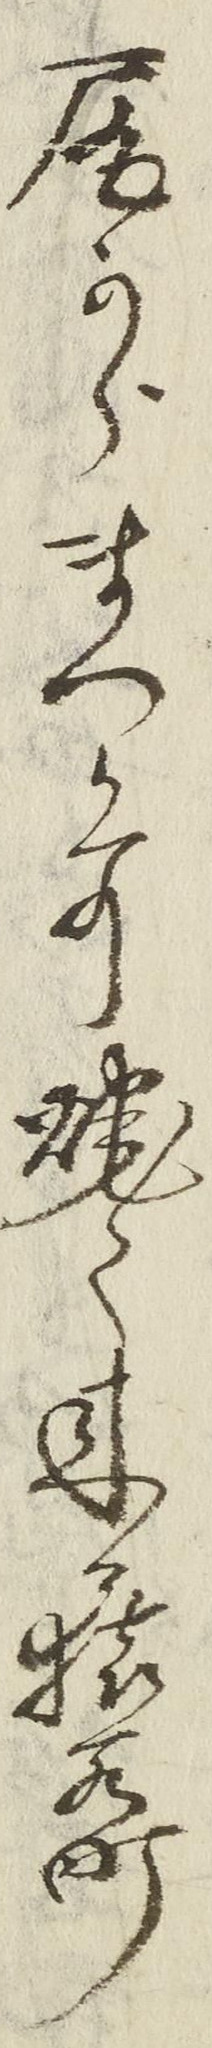尻からまつかに焼て来る猿若町〃
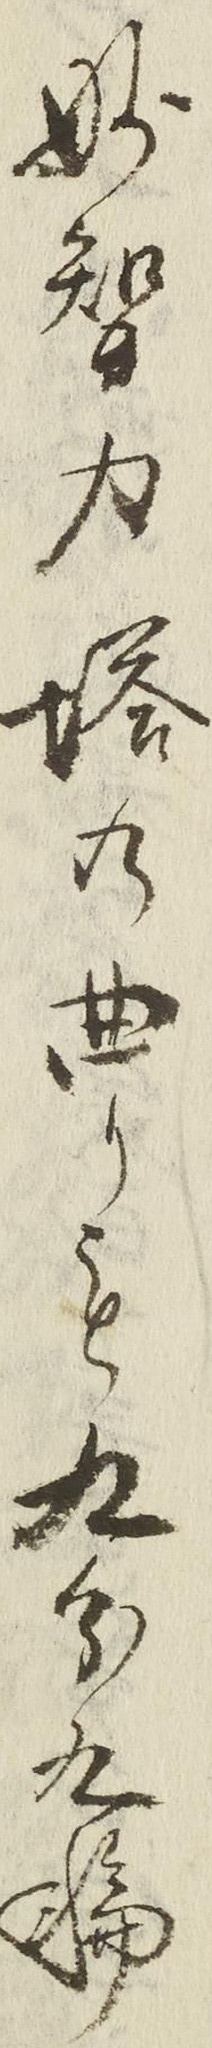妙智力塔の曲りも九分九輪〃
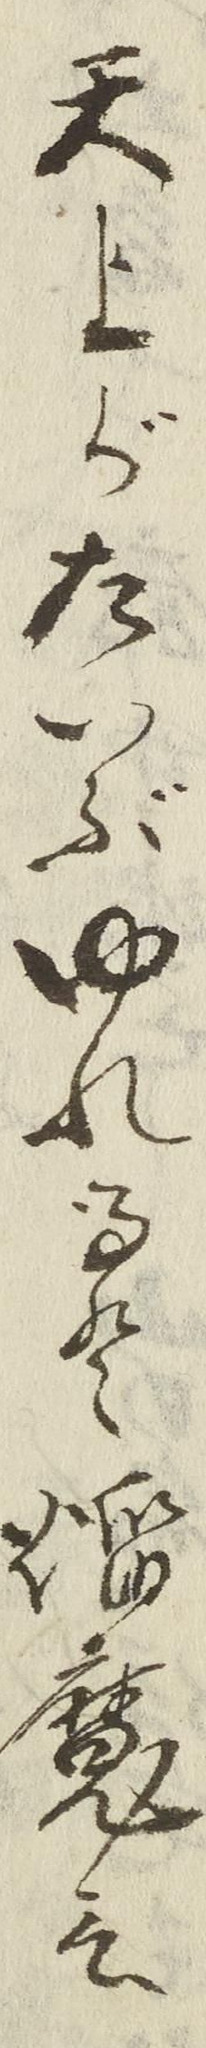天上がたいぶゆれるそ焔魔言〃
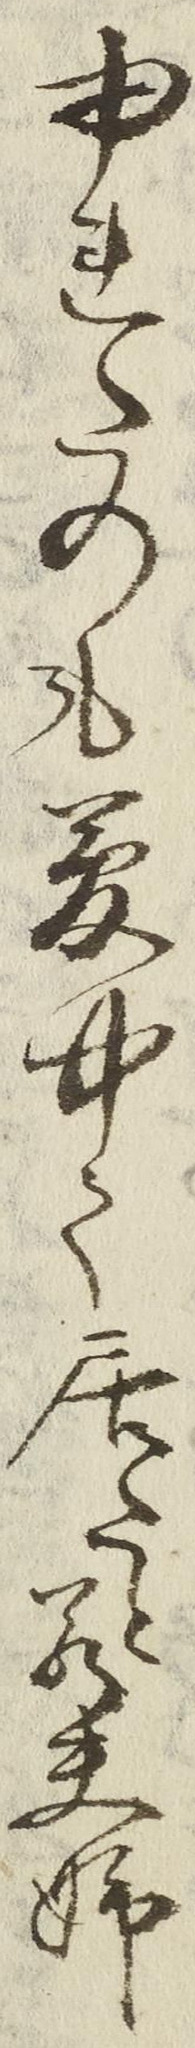ゆれたのも夢中て居たと若夫婦〃
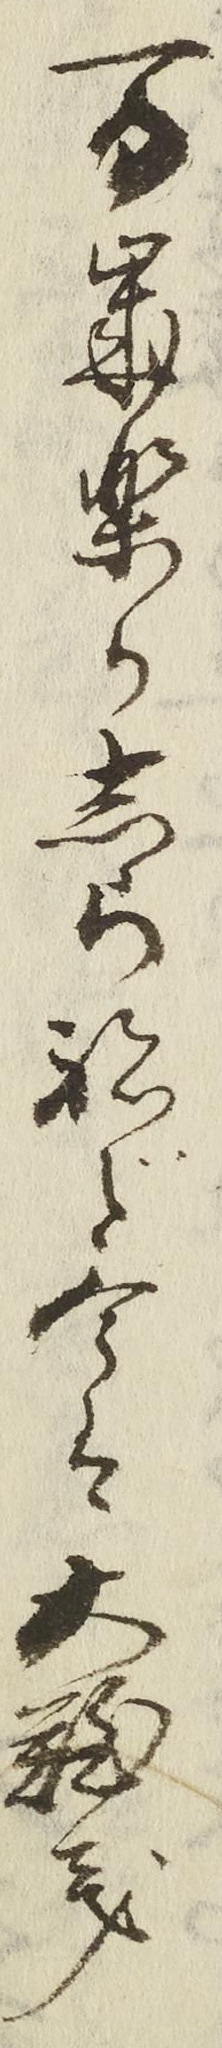万歳楽かしらねど今は大難義〃
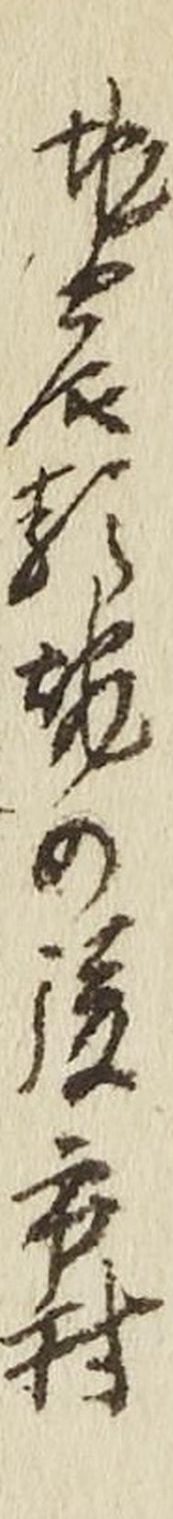地震類焼の後市村
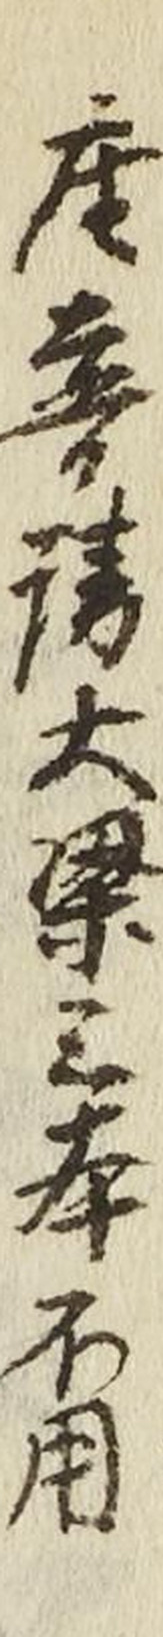座普請大梁三本不用
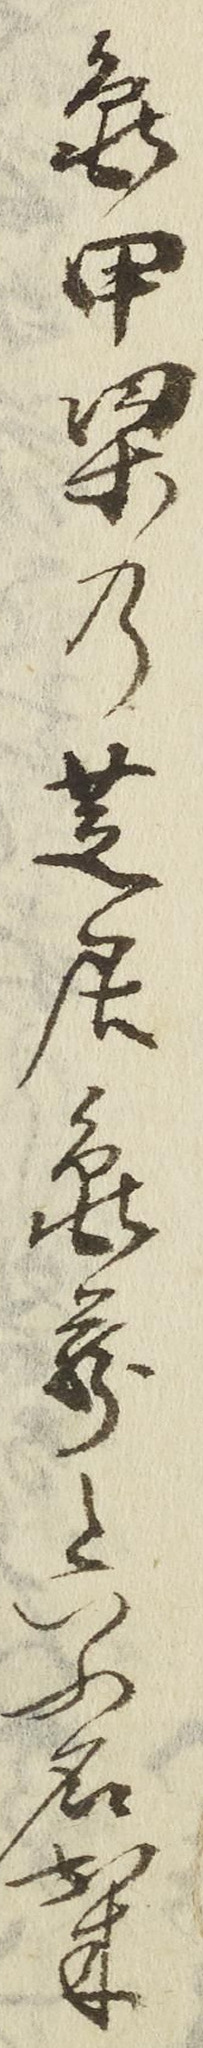亀甲梁の芝居亀蔵といふ名出来〃
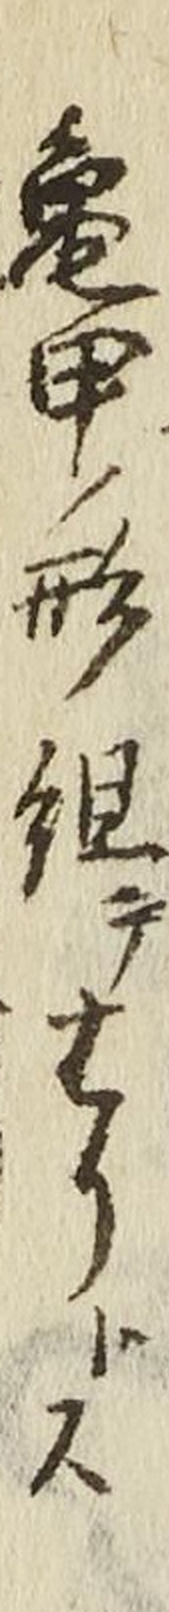亀甲ノ形組テはりトス
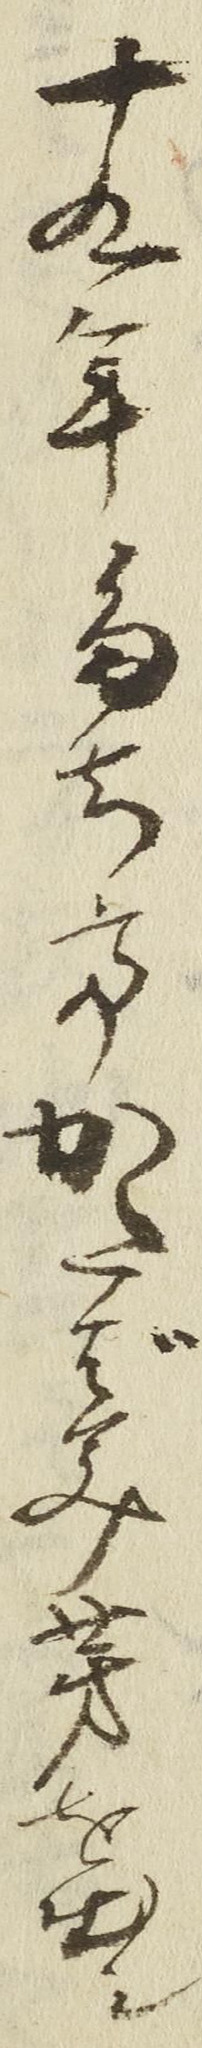十九年たちてかたばみ茅を出シ〃
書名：安政二年震災記事　完
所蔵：東京大学地震研究所図書室 Earthquake Research Institute Library, The University of Tokyo, JAPAN
